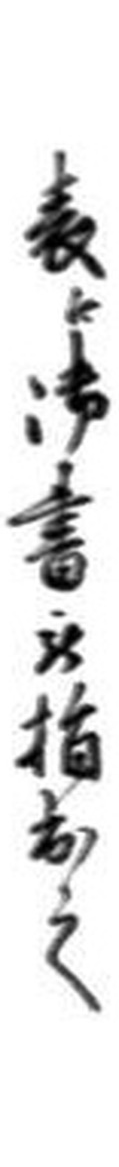表江御書被指出之
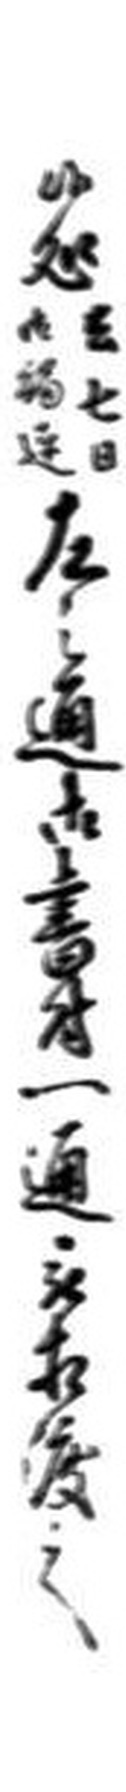御触達左之通御書付一通被相渡之
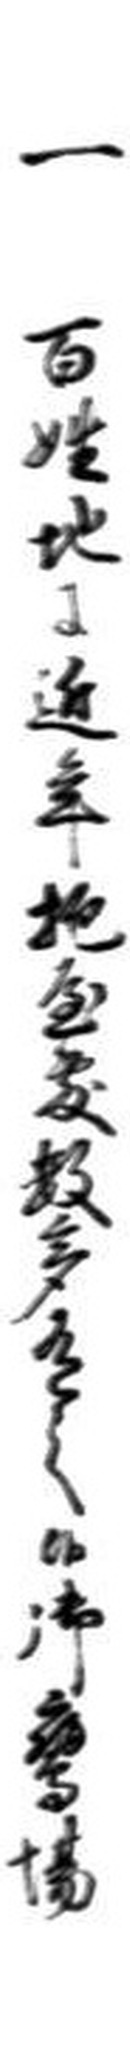一百姓地に近年抱屋敷数多有之候御鷹場
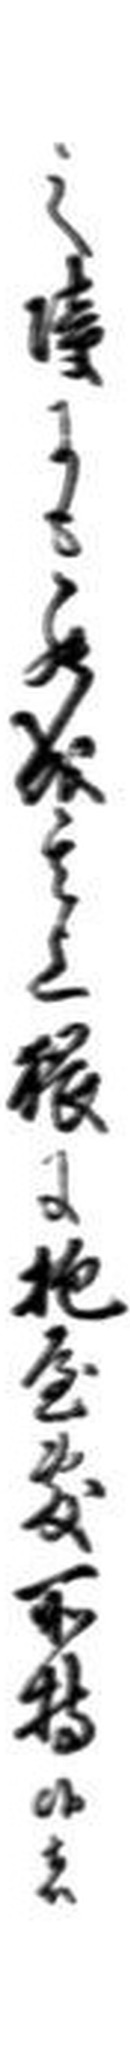之障にも罷成其上猥に抱屋敷所持候者

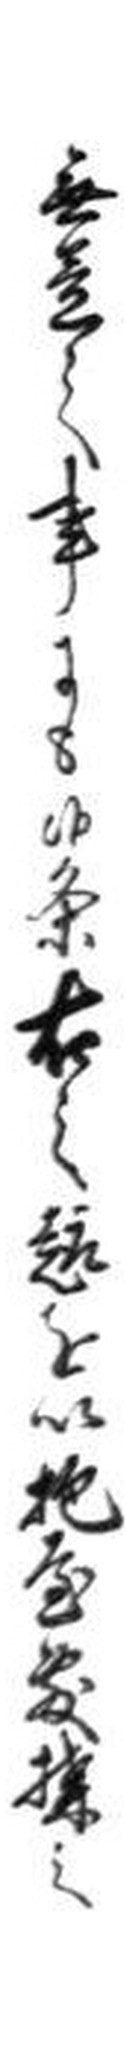無益之事にも候条右之趣を以抱屋敷構之
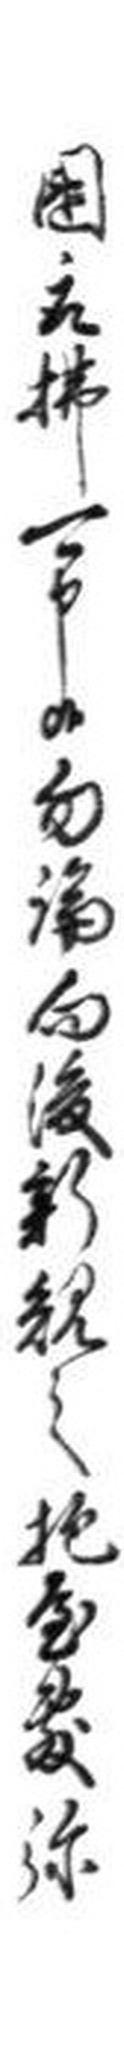囲取払可申候勿論向後新規之抱屋敷弥
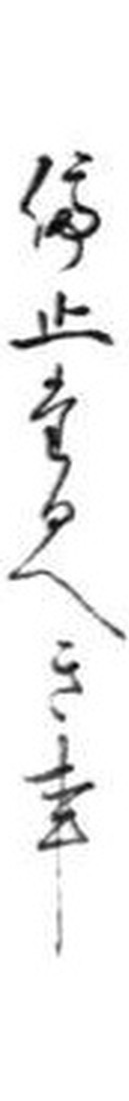停止なるへき事
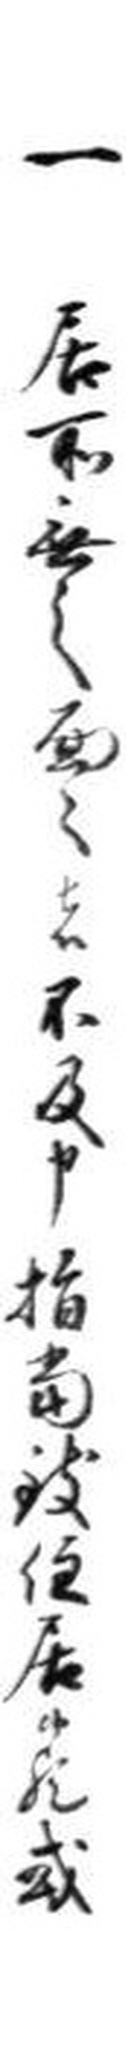一居所無之面々者不及申指当致住居候歟或
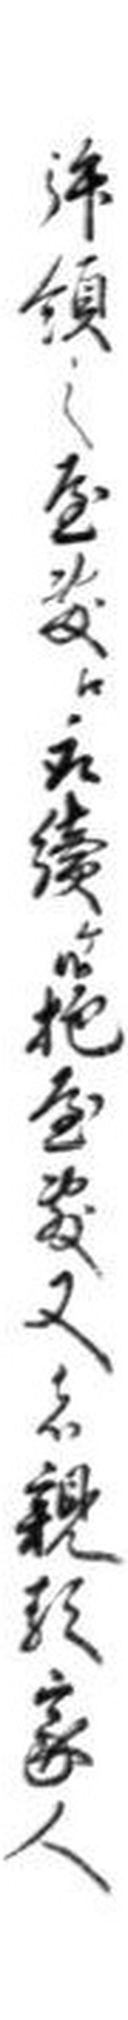拝領之屋敷江取続ケ候抱屋敷又者親類家人
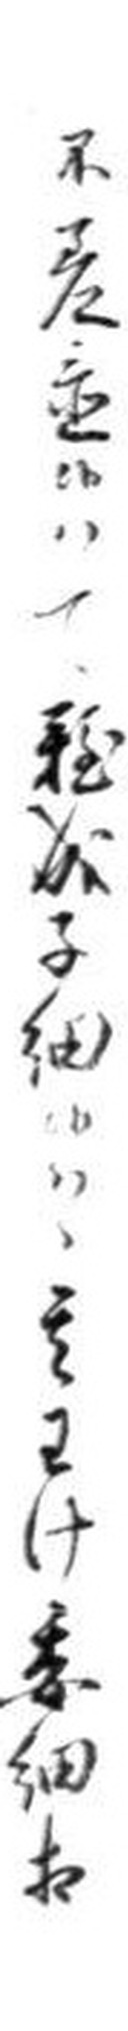不差置候ハ可難成子細候ハヽ其わけ委細相
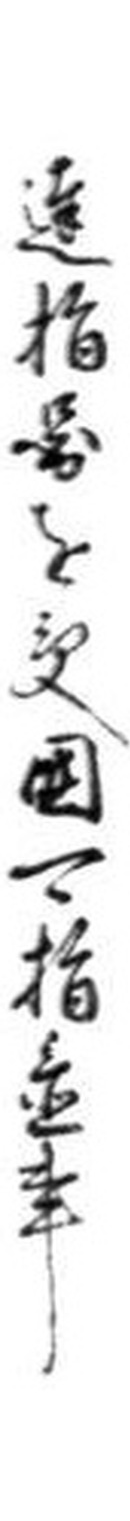達指図を受囲可指置事
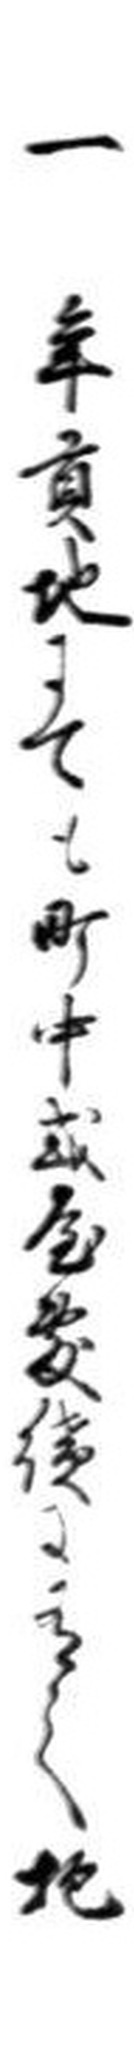一年貢地にても町中或屋敷続に有之抱
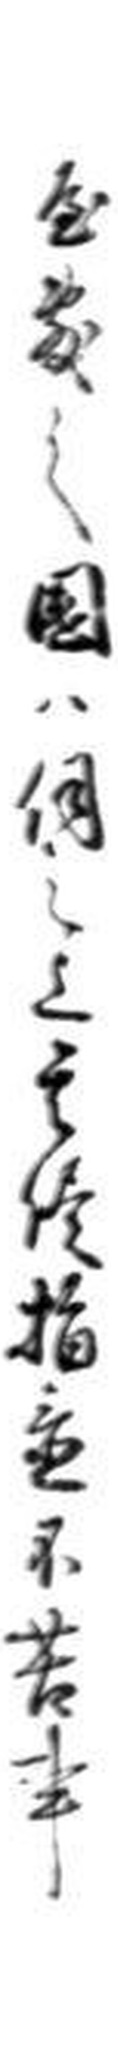屋敷之囲ハ伺之上其儘指置不苦事
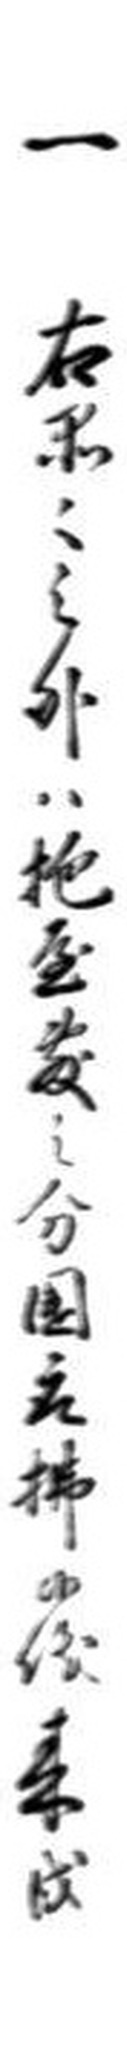一右品々之外ハ抱屋敷之分囲取払候儀来戌
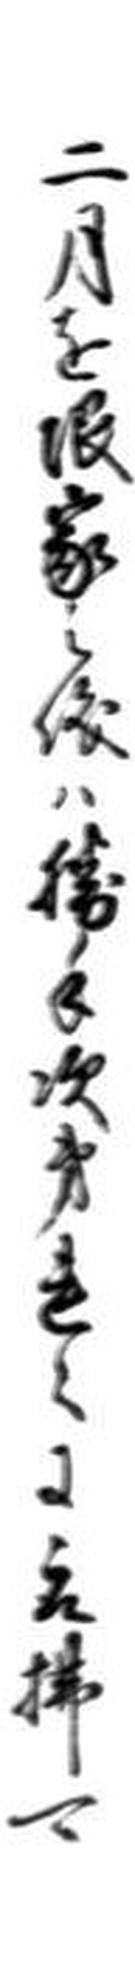二月を限家之儀ハ勝手次第連々に取払可
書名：家譜 三十二 吉邦公 従享保二年到享保三年
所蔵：福井県文書館 Fukui Prefectural Archives
